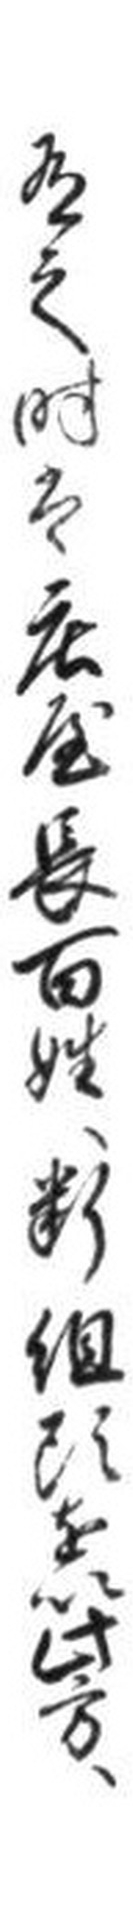有之時は庄屋長百姓へ断組頭を以此方へ
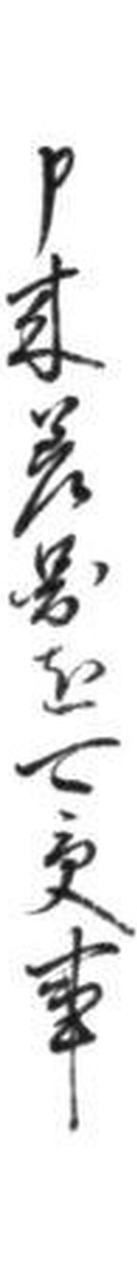申来差図を可受事
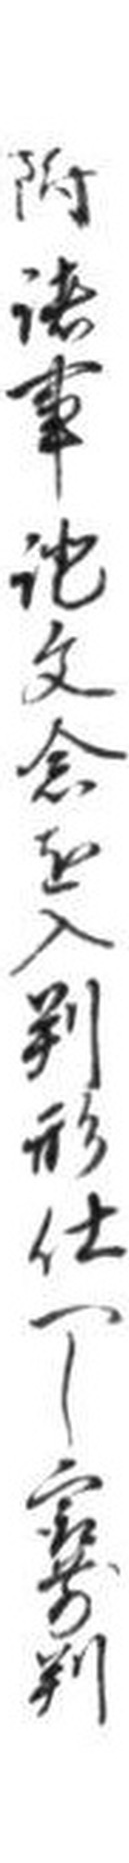附諸事証文念を入判形仕へし最前判
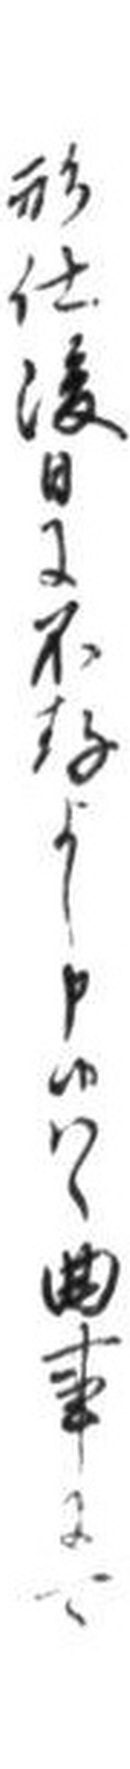形仕後日に不存よし申候はゝ曲事に可
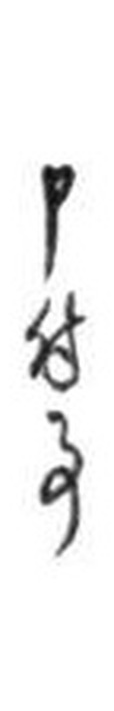申付事
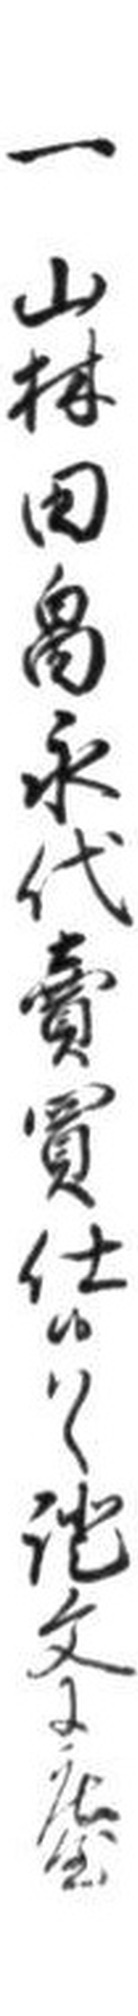一山林田畠永代売買仕候はゝ証文に庄屋
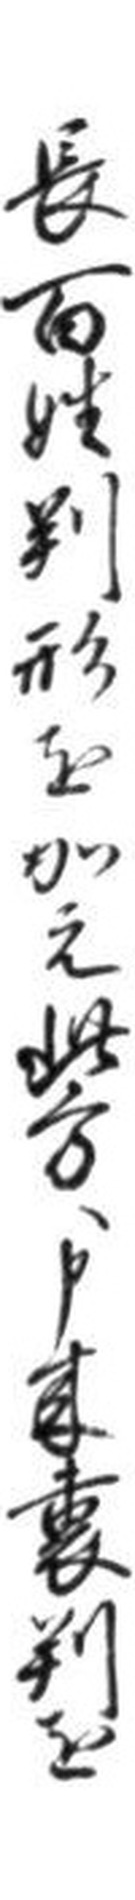長百姓判形を加え此方へ申来裏判を
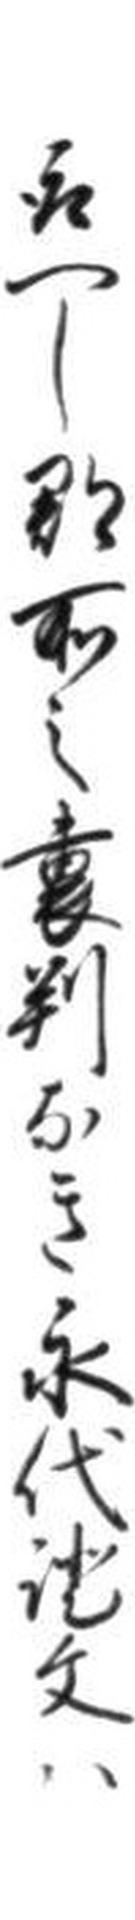取へし郡所之裏判なき永代証文は
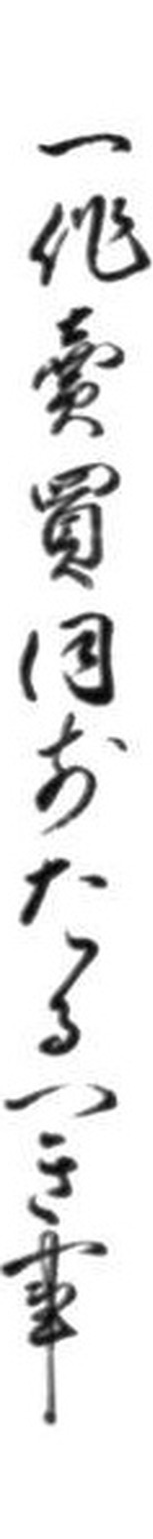一作売買同前たるへき事
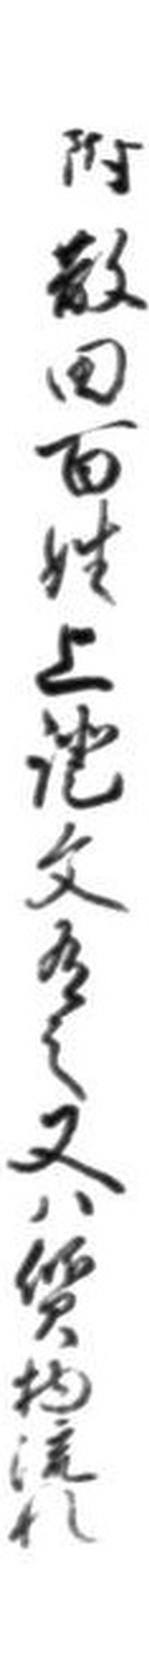附散田百姓上証文有之又は質物流れ
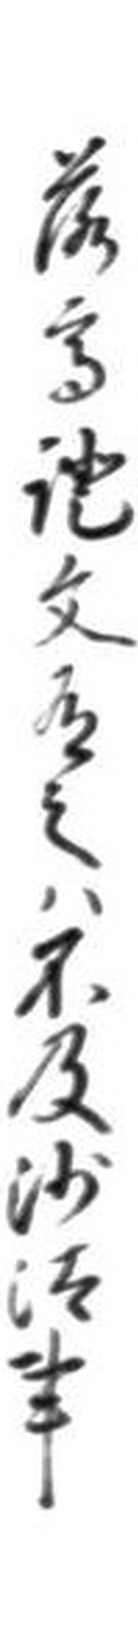落高証文有之は不及沙汰事
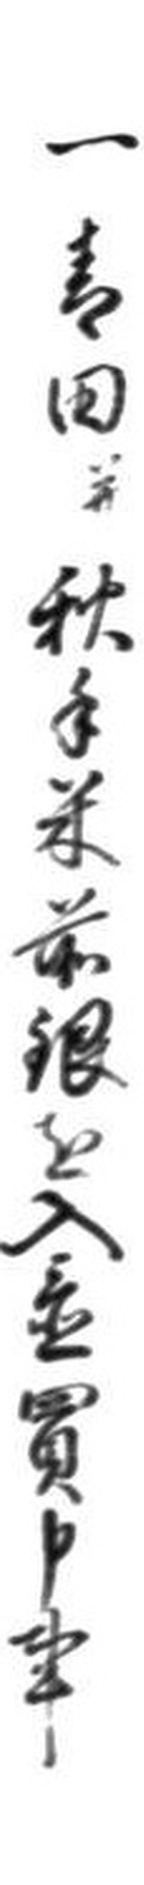一青田并秋手米前銀を入置買申事
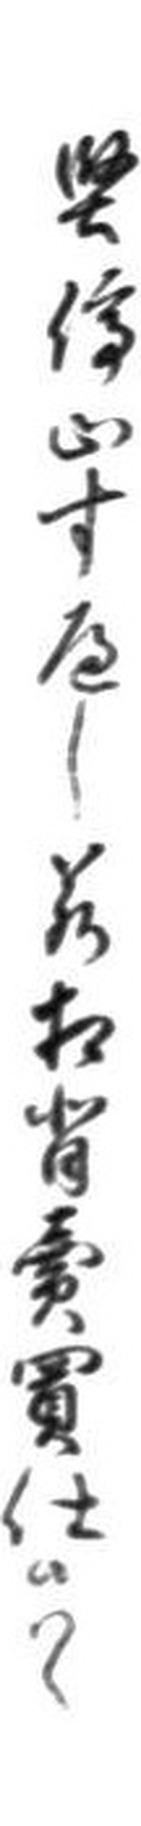堅停止すへし若相背売買仕候はゝ
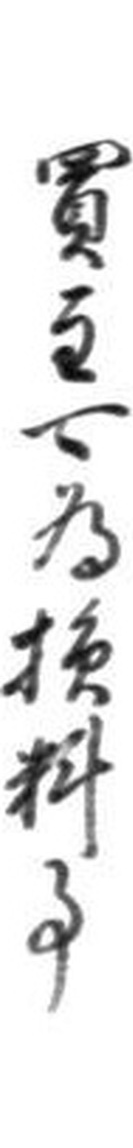買主可為損料事
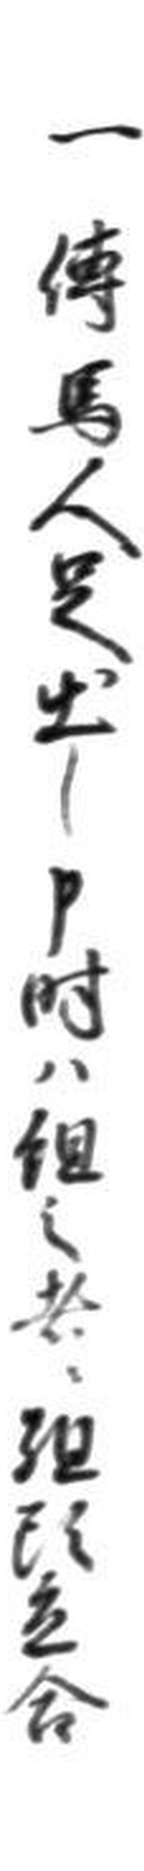一伝馬人足出し申時は組之者に組頭立合
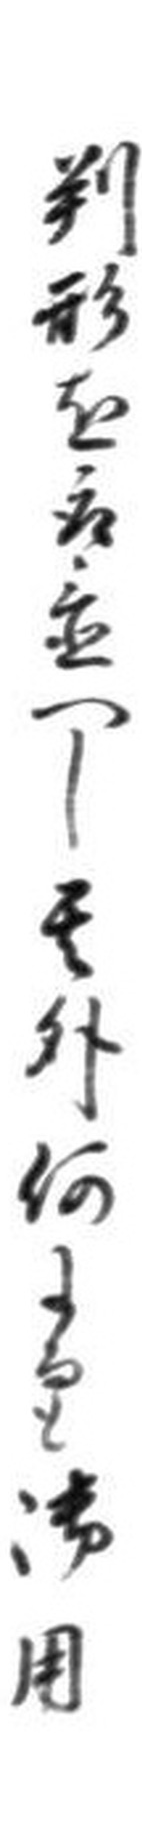判形を取置へし其外何に而も御用
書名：家譜 十六 吉品公 従貞享三年閏三月到同四年
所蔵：福井県文書館 Fukui Prefectural Archives
